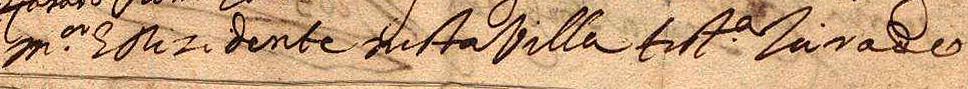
m.or E Rezidente nesta Villa test.a Iurado
